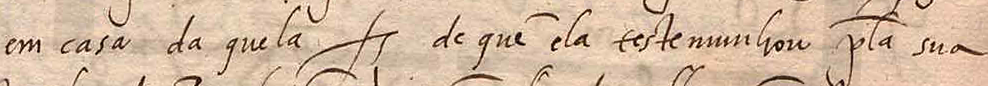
em casa daquela fꝭ de quē ela testemunhou p̄la sua
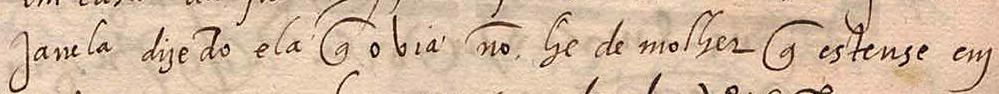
Janela dizēdo ela q̄ o via n̄o he de molher q̄ esteuse em
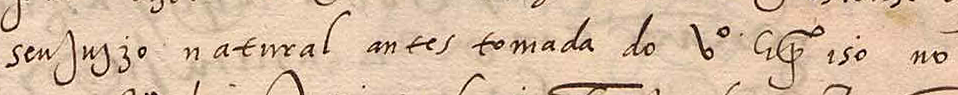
seu Jujzo natural antes tomada do vo E p̄o iso no
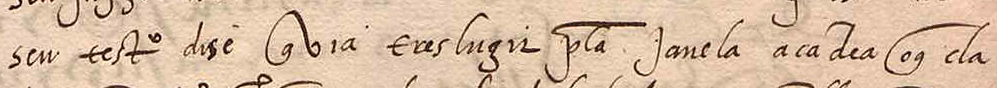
seu testo dise q̄ via treslugir p̄la Janela a cādea o q̄ ela
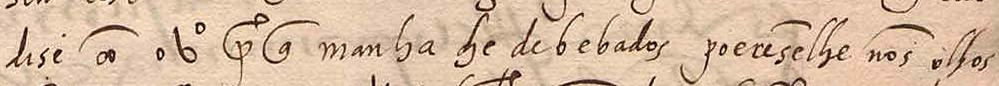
dise c̄o o vo p̄oq̄ manha he de bebados poerēse lhe nos olhos
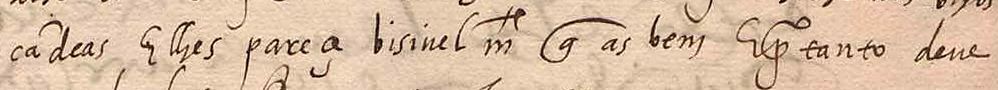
cādeas E lhes parece visiuelmte q̄ as vem E p̄otanto deue
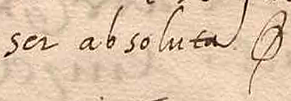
ser absoluta
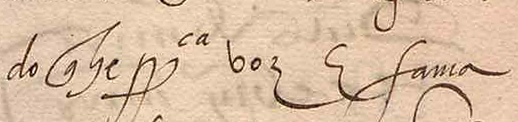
do q̄ he ꝑꝑca voz E fama
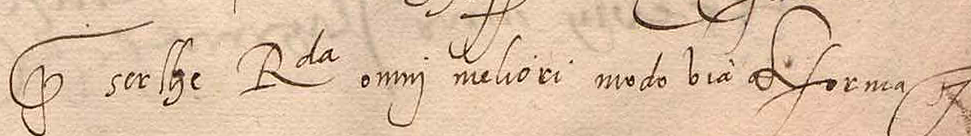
p̄ ser lhe Rda omnj meliori modo via & forma c̄ꝭ
